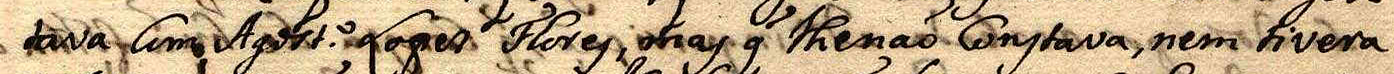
tava Com Agost.o Lopes Flores, mas q̄ lhe naõ Constava, nem tivera
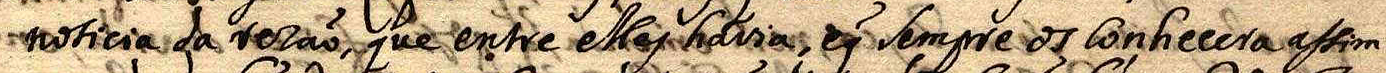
noticia da rezaõ, que entre elles havia, e q̄ sempre os conhecera assim
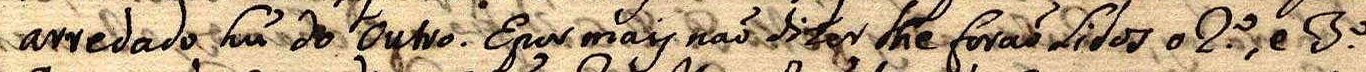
arredado hū do outro. E por mais naõ dizer lhe foraõ Lidos o 2.o, e 3.o
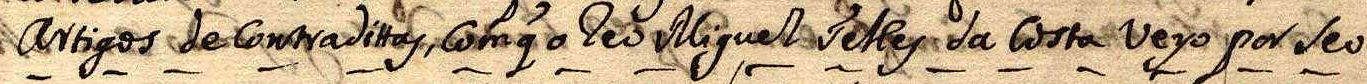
artigos de contradittas, com q̄ o Reo Miguel Telles da Costa veyo por seo
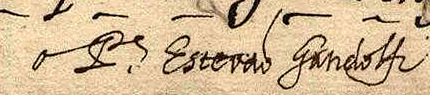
o P.e Estevaõ Gandolfi
